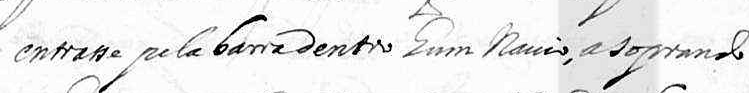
entrasse pela barra dentro hum Nauio, e soprando
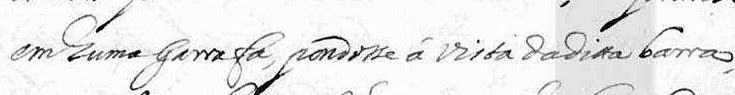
em huma garrafa, pondosse á vista da ditta barra,
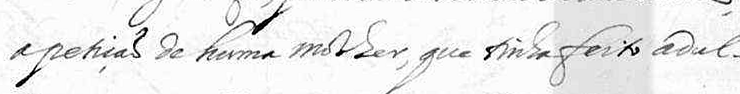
a petiçaõ de huma molher, que tinha feito adul
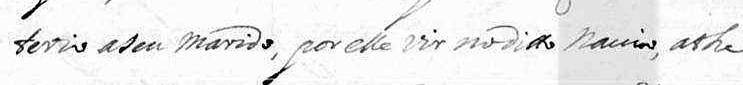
terio a seu marido, por elle vir no ditto nauio, athe
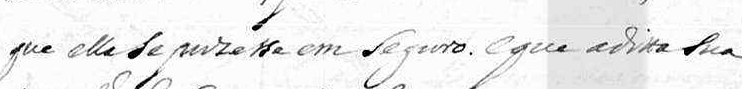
que elle se puzesse em seguro. E que a ditta sua
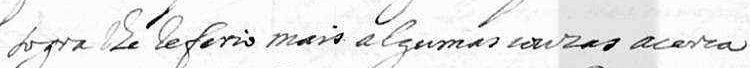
sogra he Referio mais algumas couzas acerca
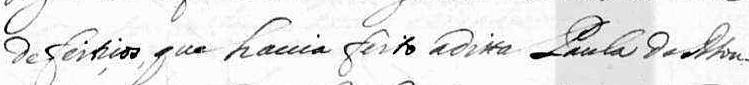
de feitiços que hauia feito a ditta Paula de Mou
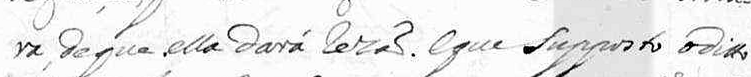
ra, de que ella dará Rezaõ. e que supposto o ditto
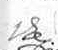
lhe
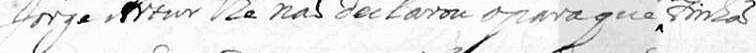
Jorge Artur lhe naõ declarou o para que tinha
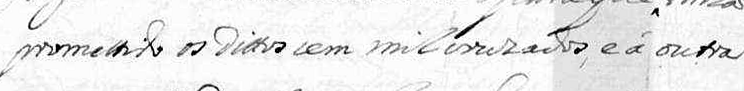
promettido os dittos sem mil cruzados, e á outra
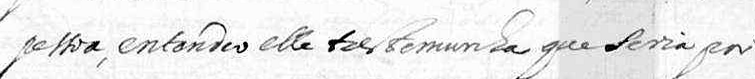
pessoa, entendeo elle testemunha que seria por
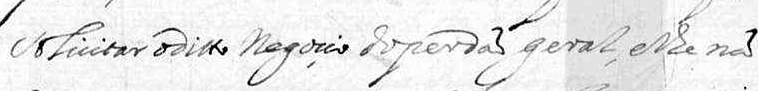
solicitar o ditto negocio do perdaõ geral, e lhe naõ
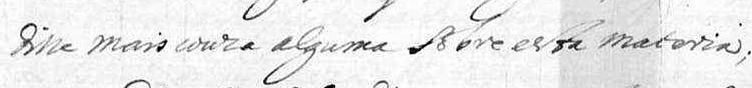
disse mais couza alguma sobre esta materia,
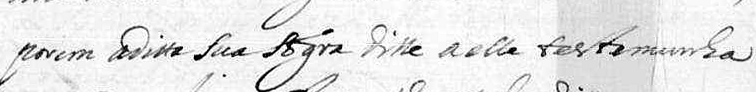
porem a ditta sua sogra disse a elle testemunha
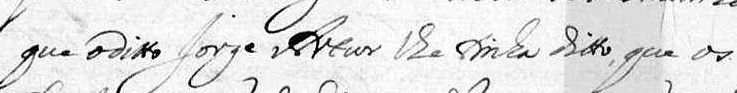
que o ditto Jorge Artur lhe tinha ditto que os
